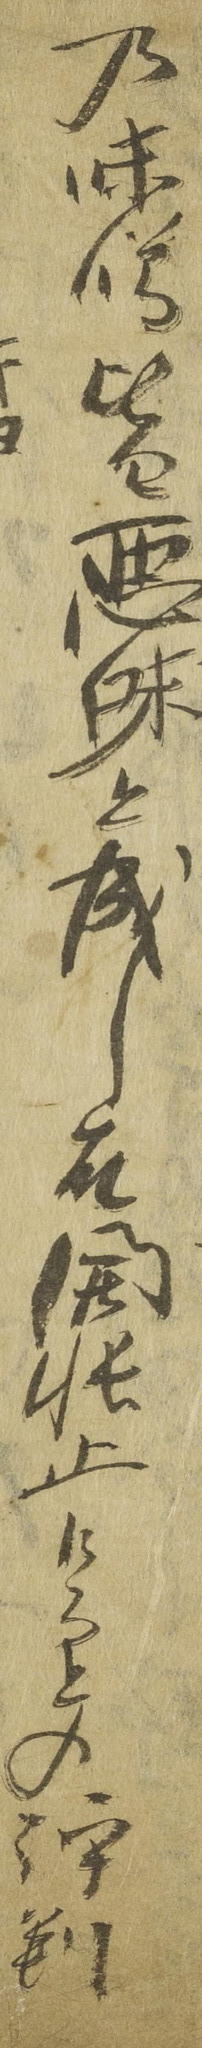の味僧皆悪味と成し故開帳止けるとの評判
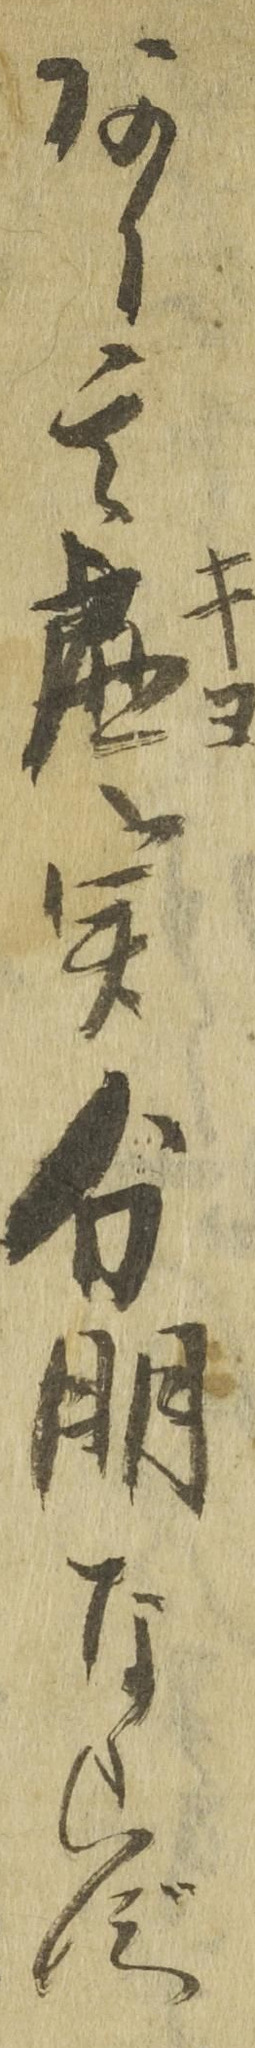あり其虚実分明ならず
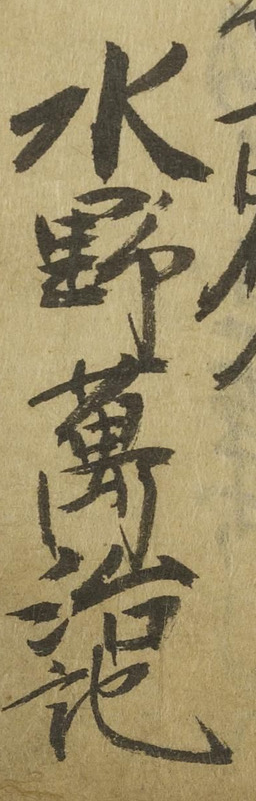水野萬治記
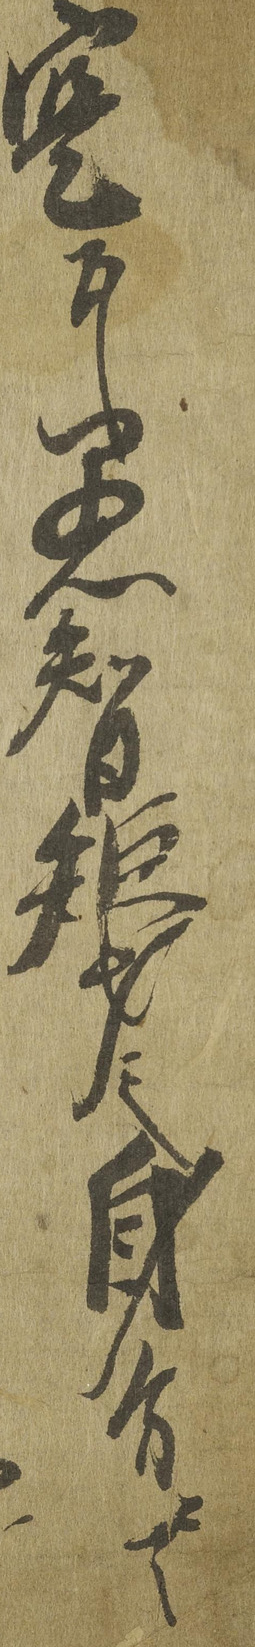寔に愚智矩才之身分ニて
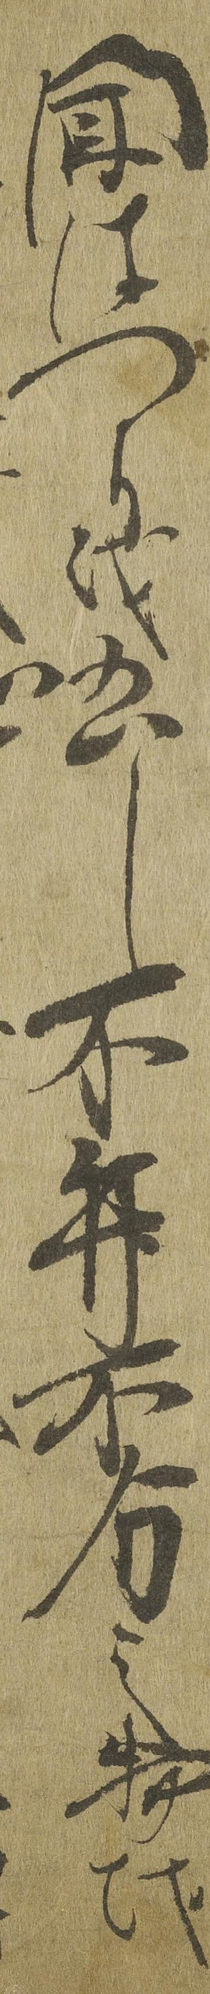聞はつりを合し不弁不分之物を
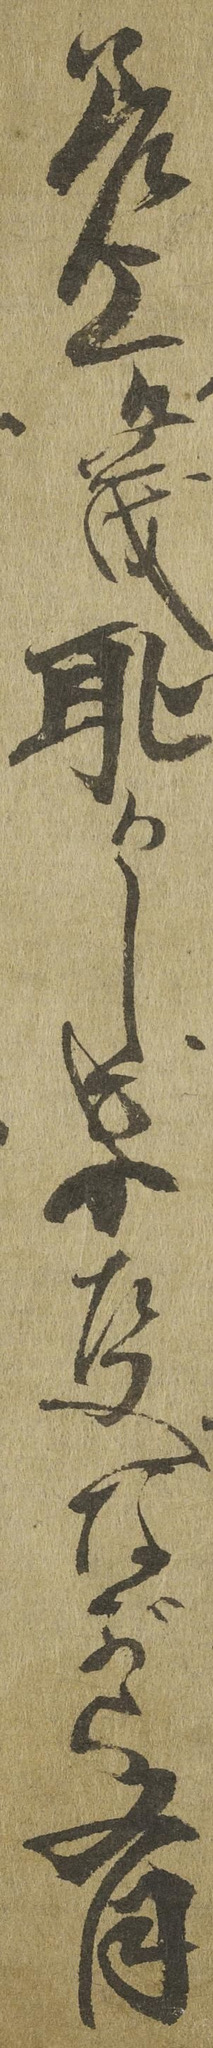差上ルも恥かしき事ながら有
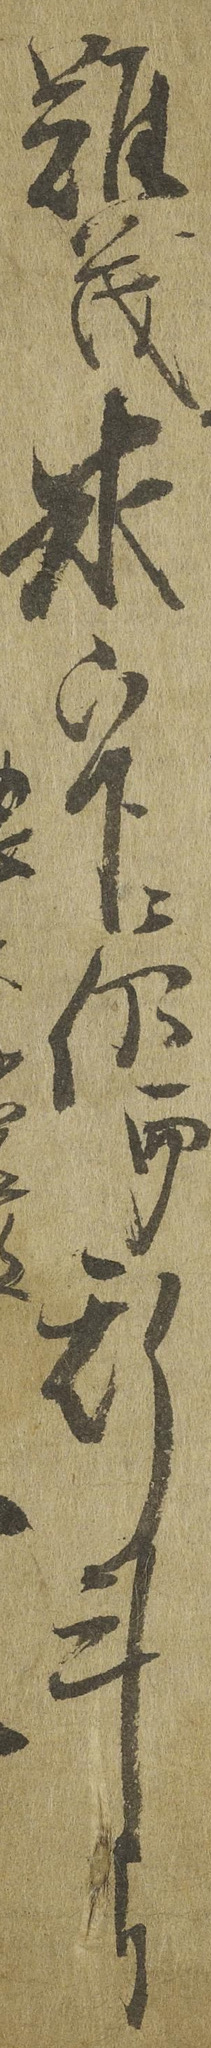難も求被下ニ仍而斯計り
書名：善光寺地震聞書
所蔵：東京大学地震研究所図書室 Earthquake Research Institute Library, The University of Tokyo, JAPAN
